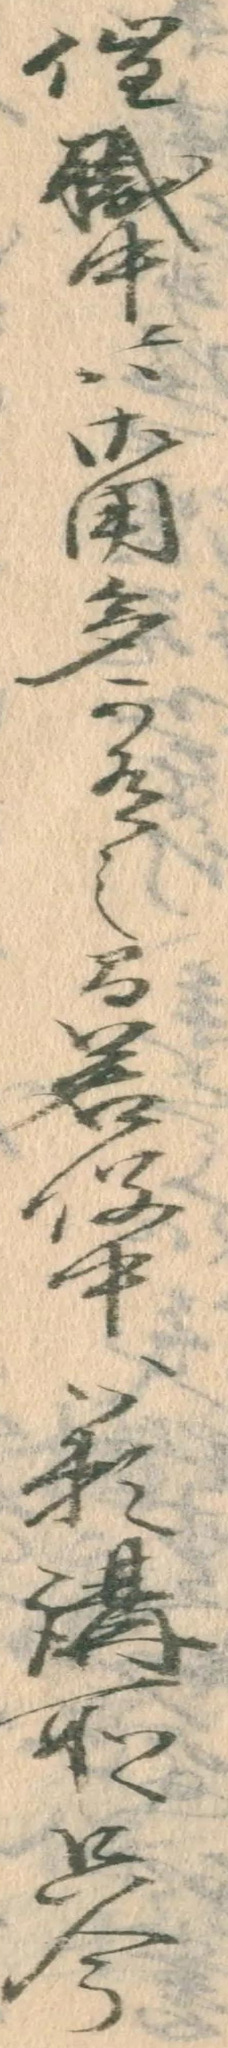催職中ニハ御用多可有之間若役中へ御頼講所へ只今
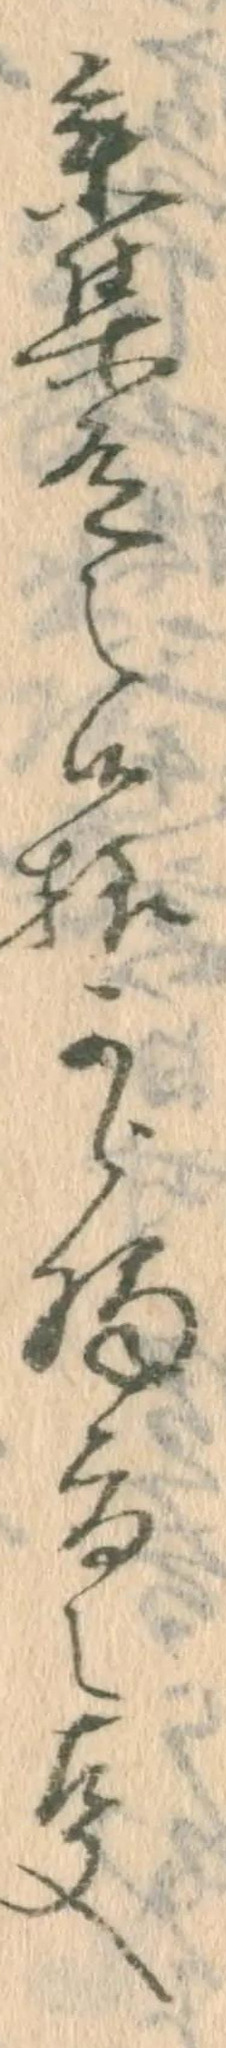参集有之候様可被触旨之事
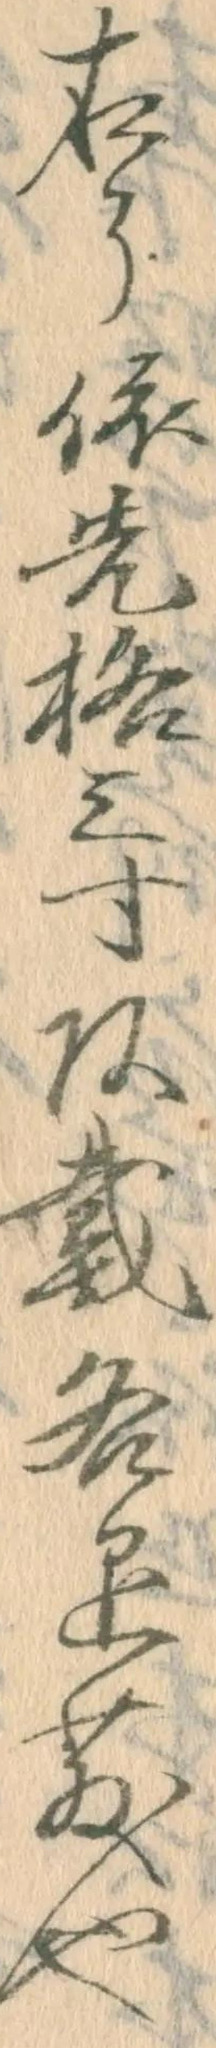右了依先格三寸頂戴各退散也
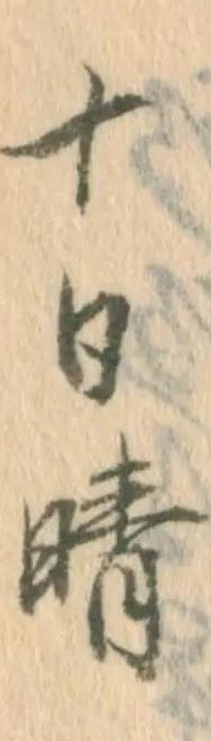十日晴

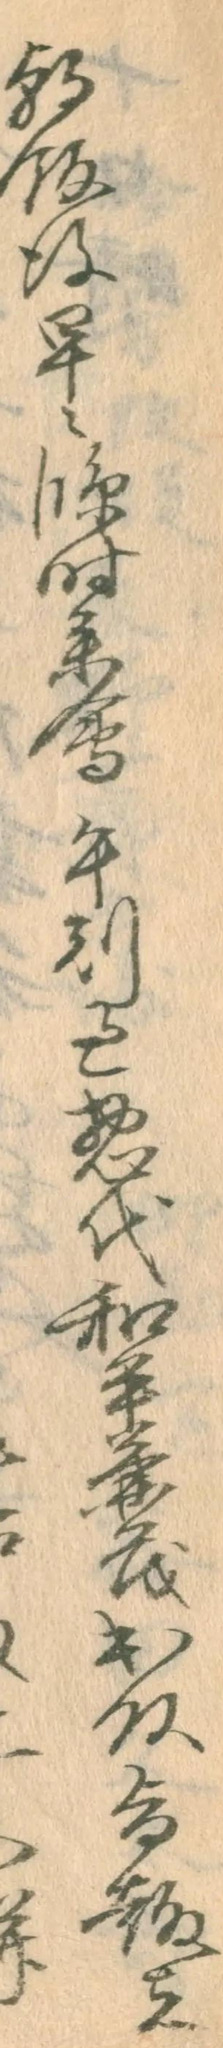一朝飯後早々臨時参会午刻過惣代和平兼茂出頭旨趣は
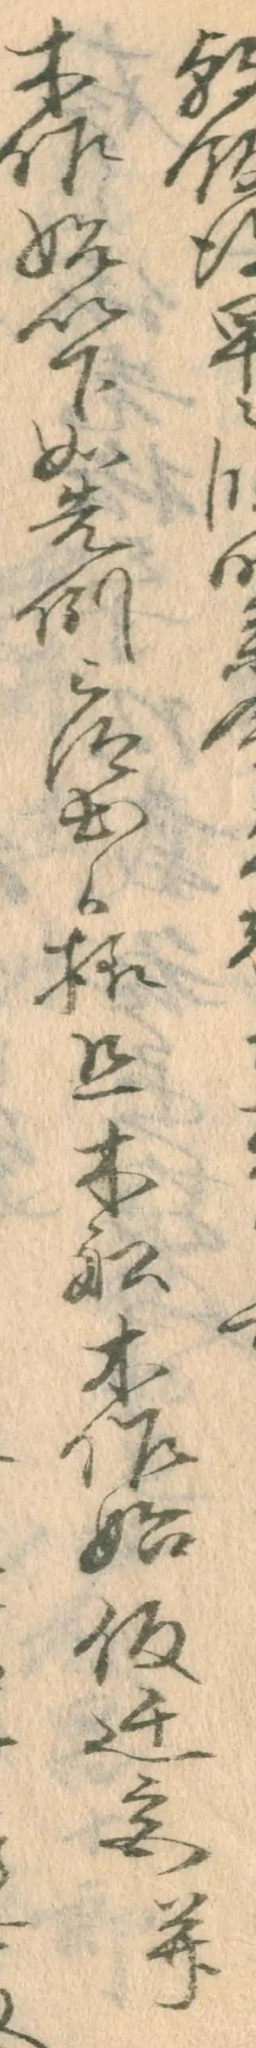本作始以下如先例被仰出候様且木船木作始仮迁宮并
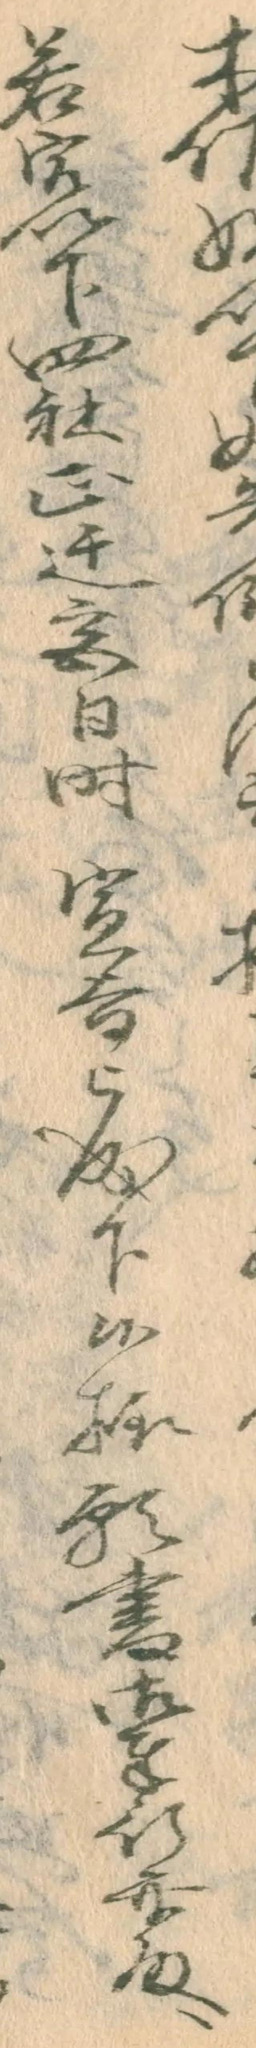若宮以下四社正迁宮日時宣旨被成下候様願書御奉行弁殿へ
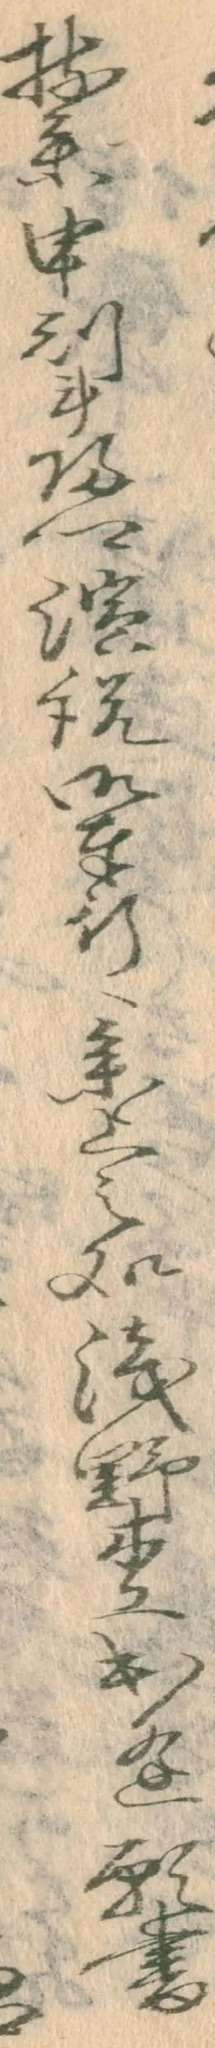持参申刻計帰郷演説御奉行へ参上之処浅野杢出逢願書
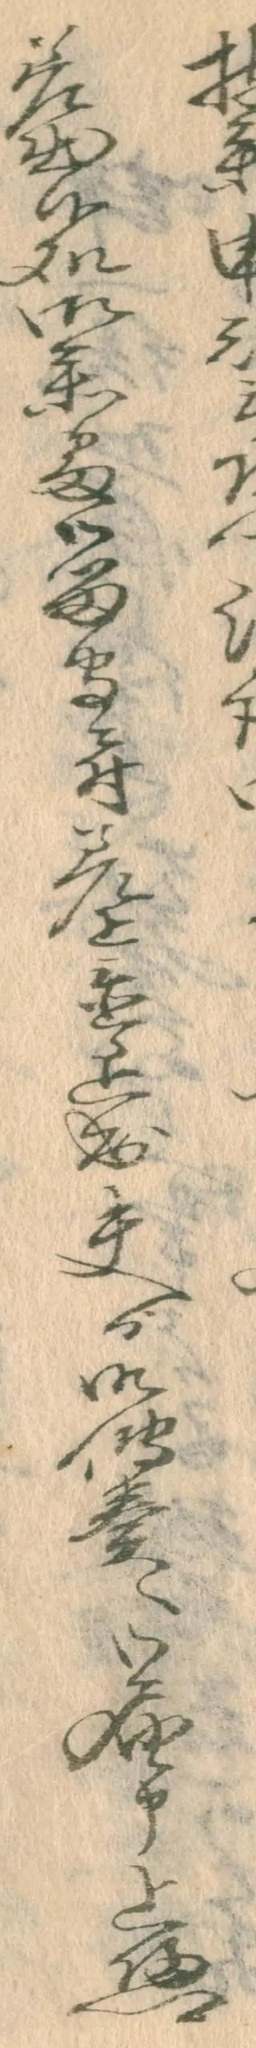差出候処御参番御留守ニ付差上置退出夫ゟ御伝奏へ御届申上帰郷
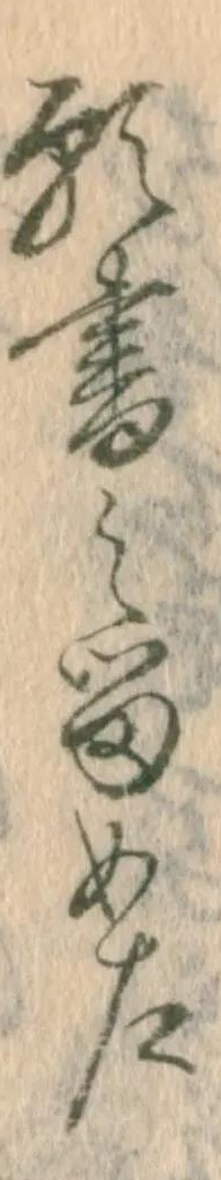願書之留如左
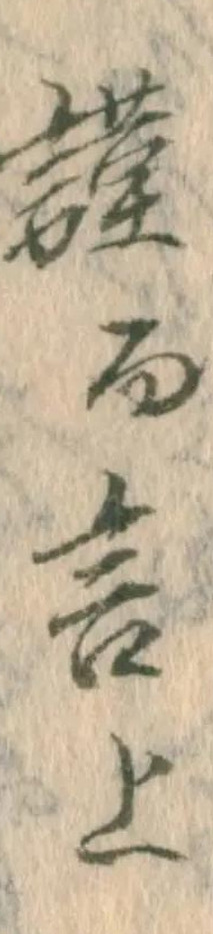謹而言上
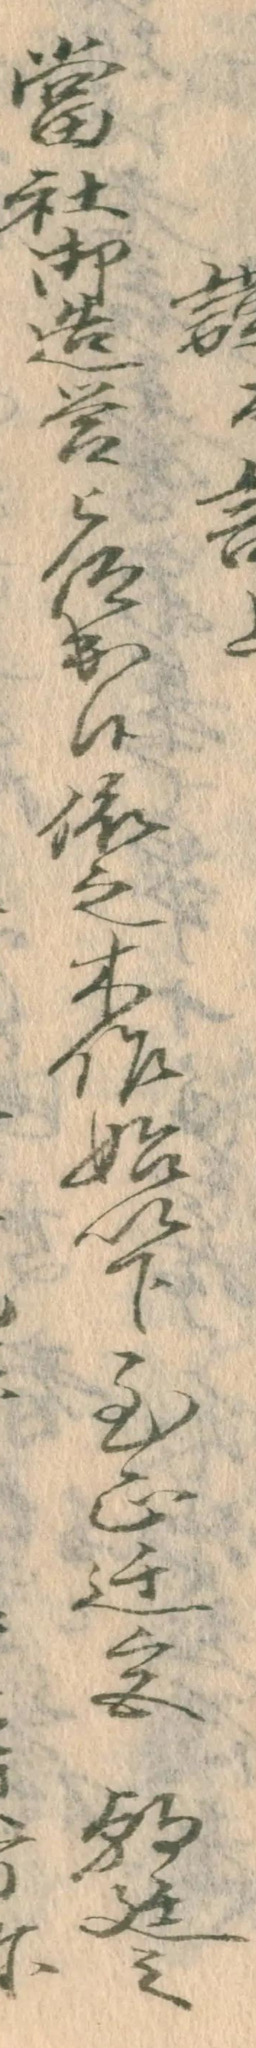当社御造営被仰出候依之木作始以下至正迁宮朝廷之
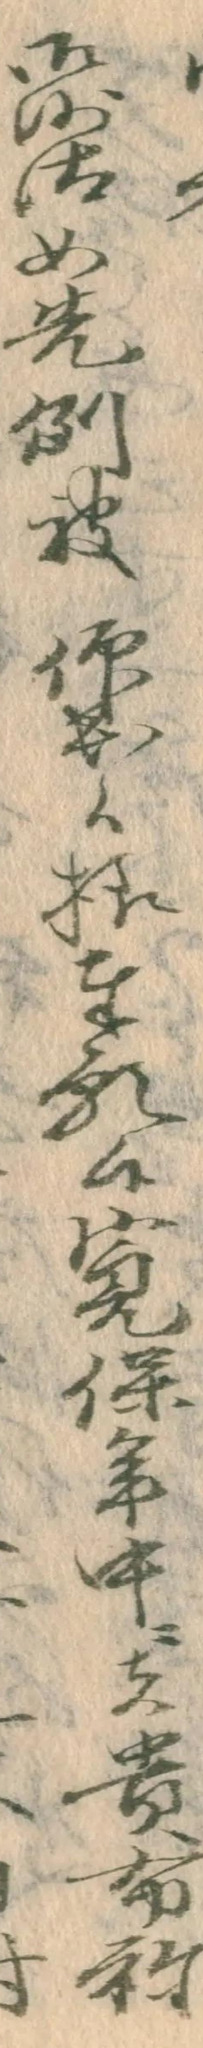御沙汰如先例被仰出候様奉願候寛保年中ニは貴布祢
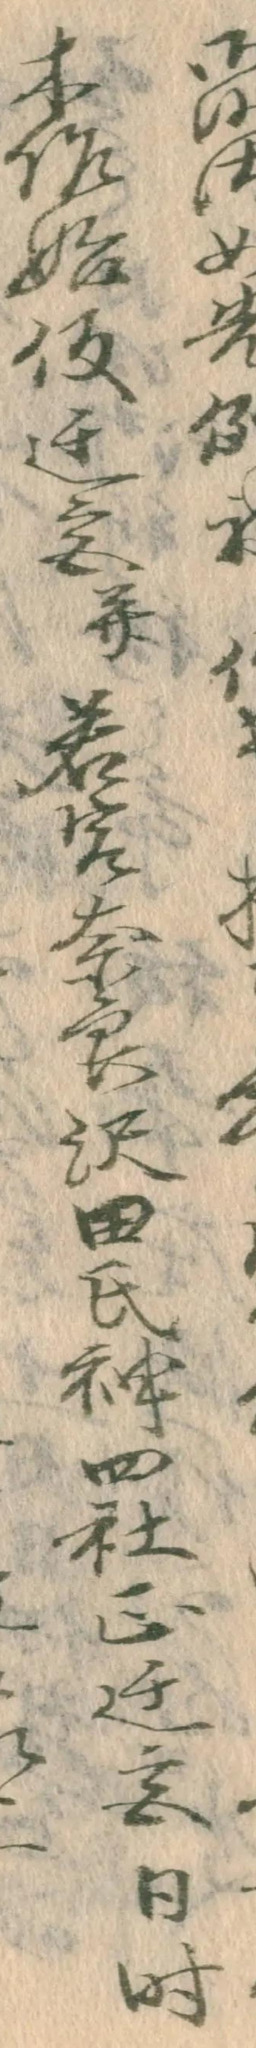木作始仮迁宮并若宮奈良沢田氏神四社正迁宮日時
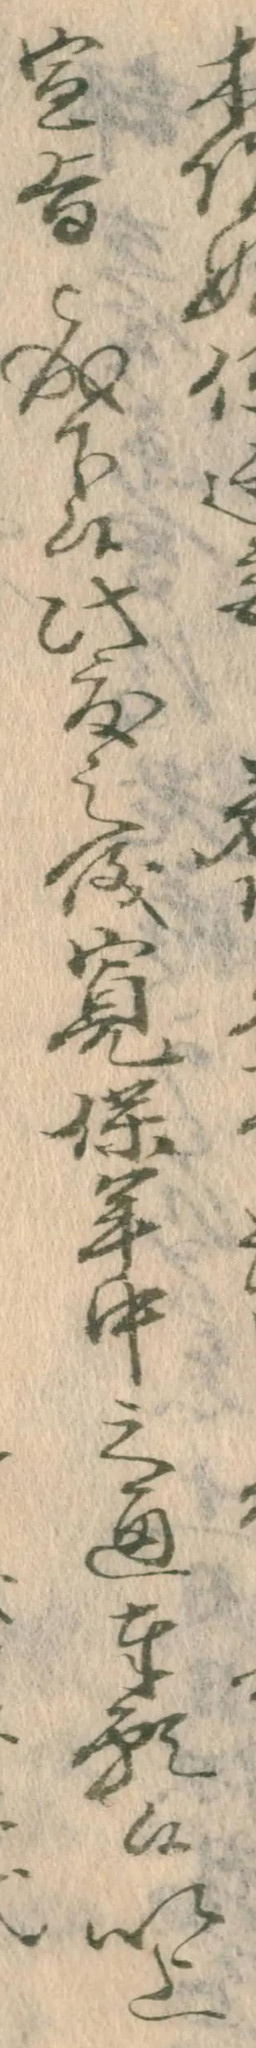宣旨被成下候此度之儀寛保年中之通奉願候以上
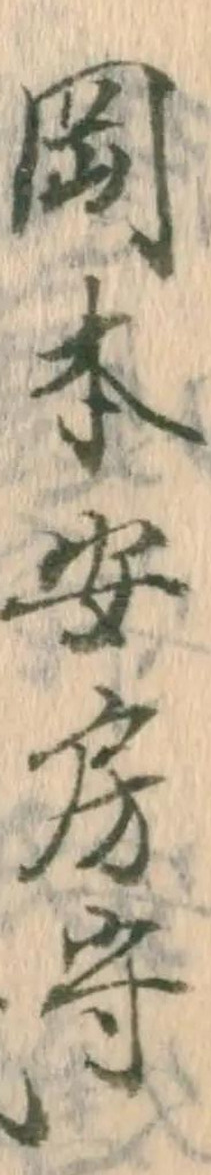岡本安房守
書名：賀茂社記録. 第17冊
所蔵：国立国会図書館 National Diet Library, JAPAN
